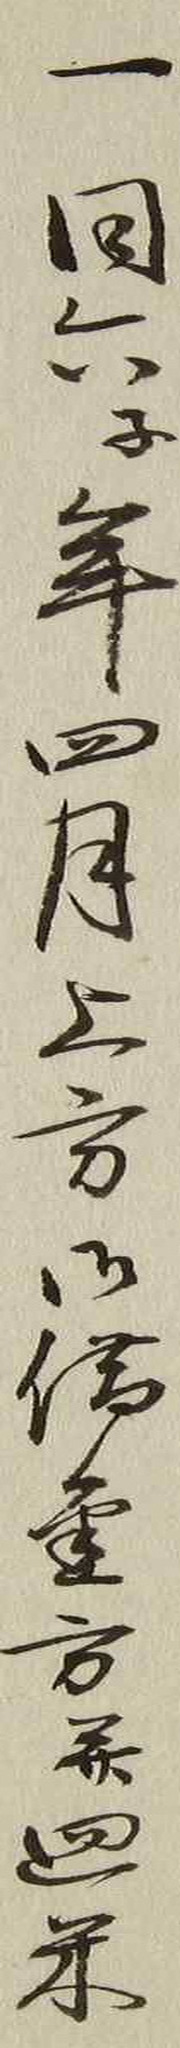一同六子年四月上方御借金方幷廻米
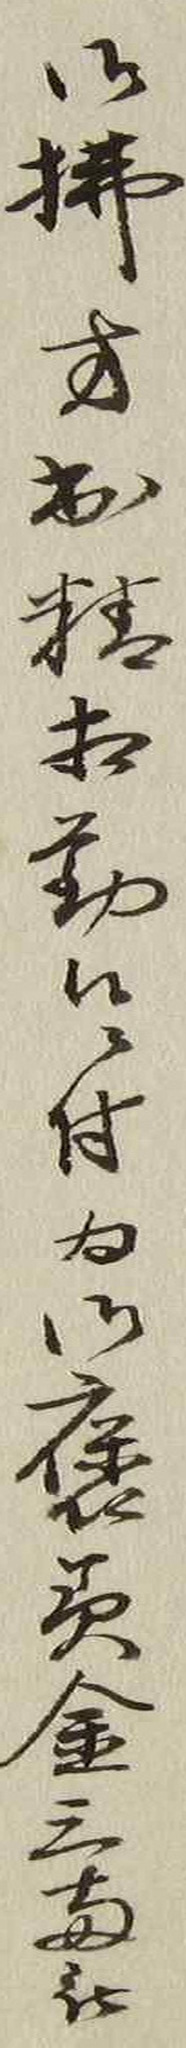御払方出精相勤候ニ付ゐ御褒美金三両被
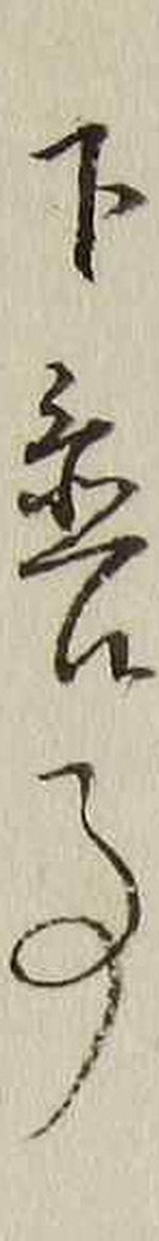下置候事
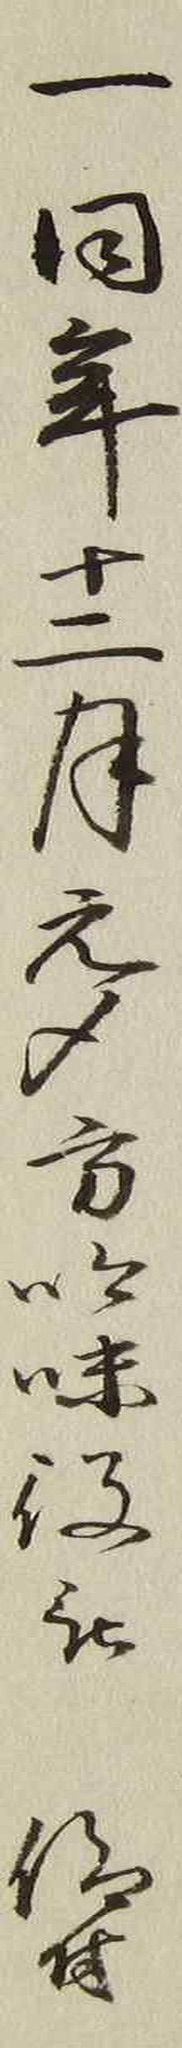一同年十二月元〆方吟味役被仰付
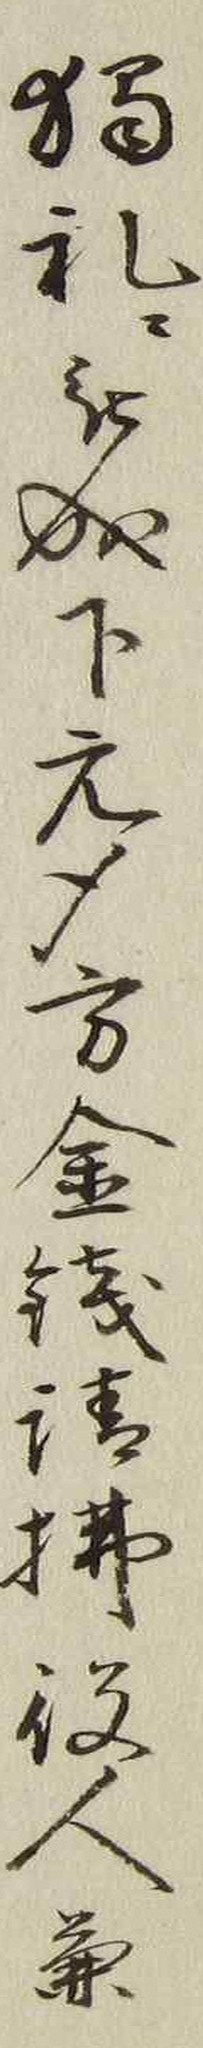独礼ニ被成下元〆方金銭請払役人兼
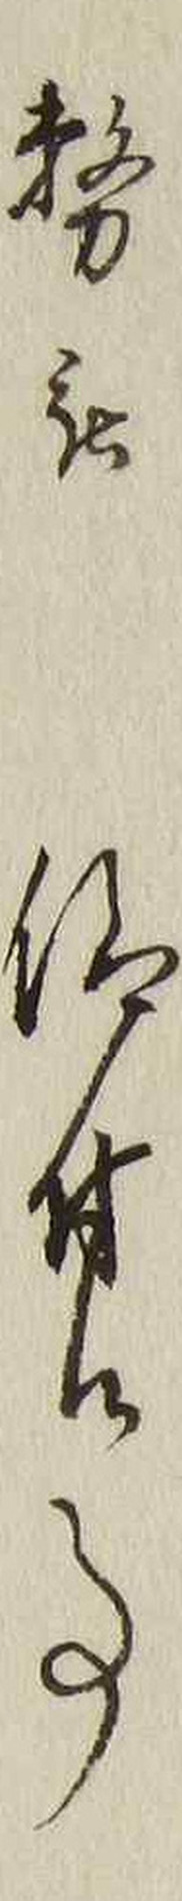務被仰付候事
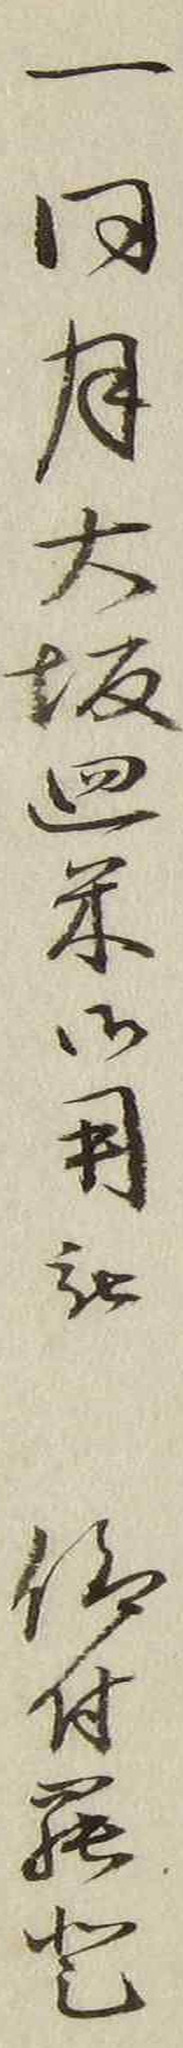一同月大坂廻米御用被仰付罷登
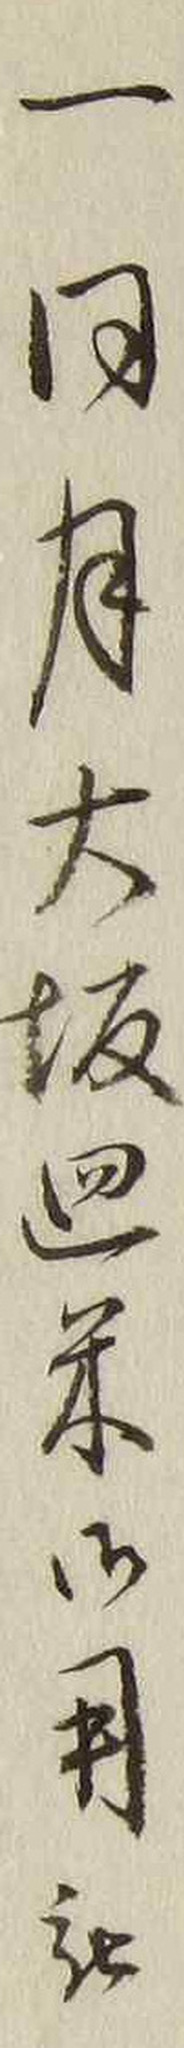一同月大坂廻米御用被仰付罷登
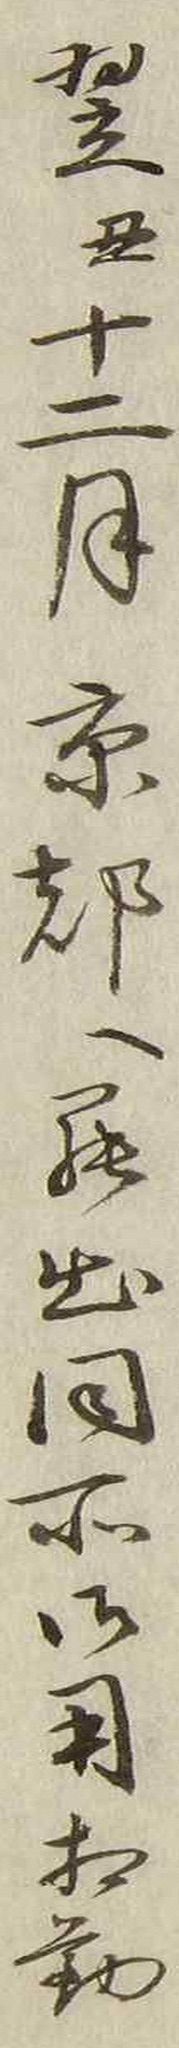翌丑十二月京都へ罷出同所御用相勤

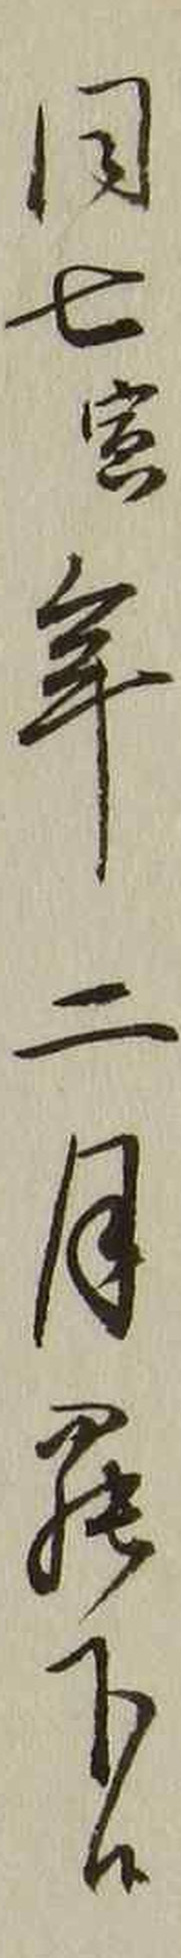同七寅年二月罷下候
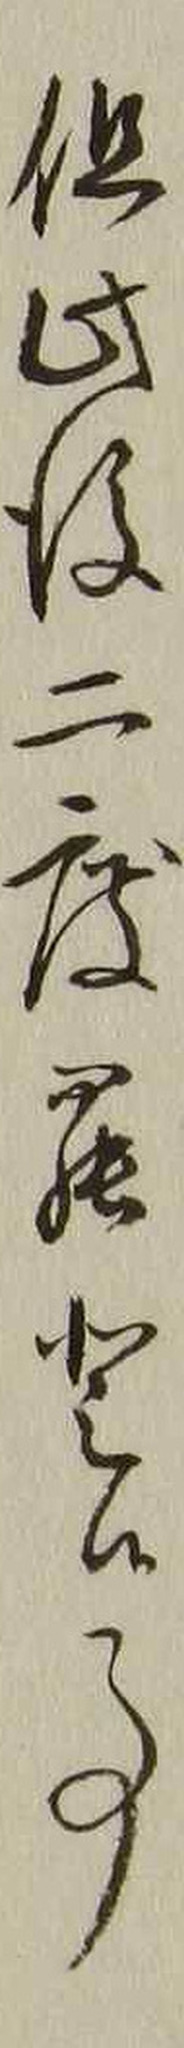但此後二度罷登候事
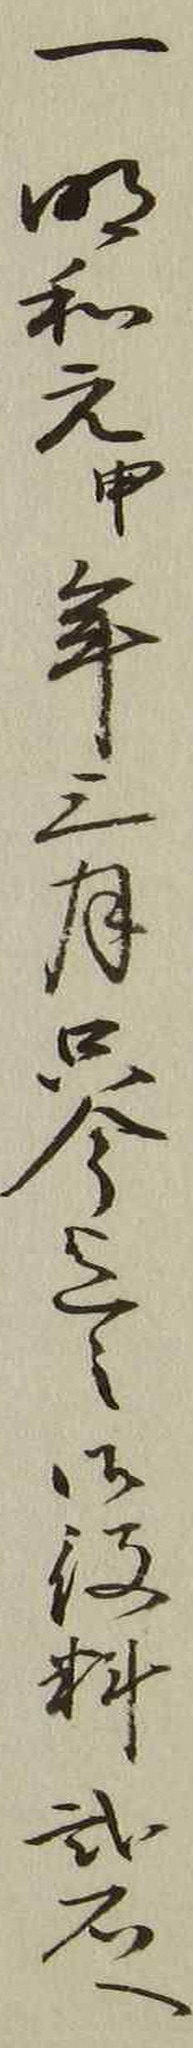一明和元申年三月只今迄之御役料弐石へ
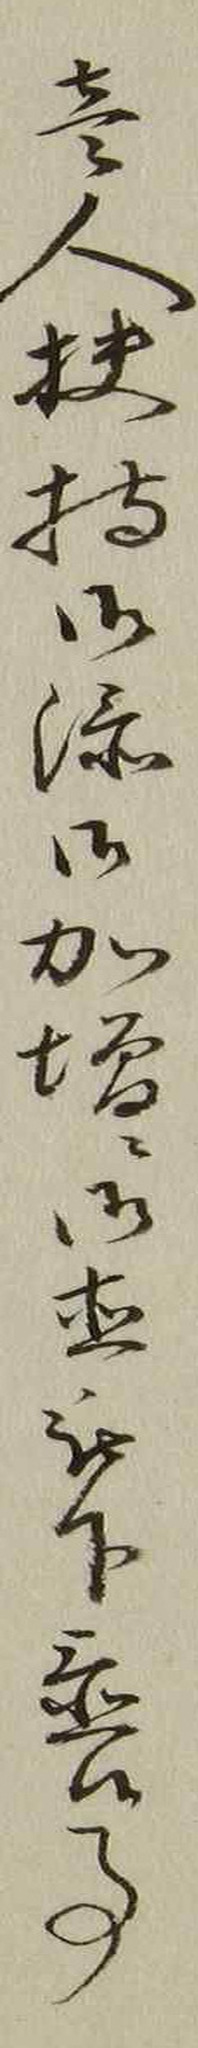壱人扶持御添御加増ニ御直被下置候事
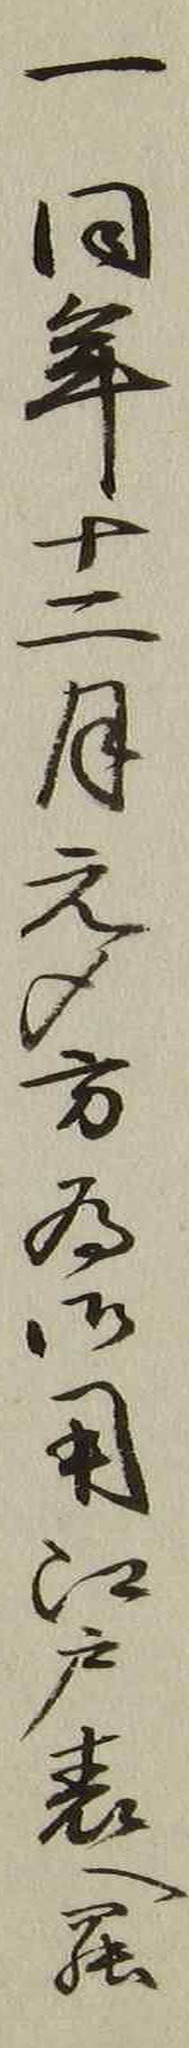一同年十二月元〆方為御用江戸表へ罷
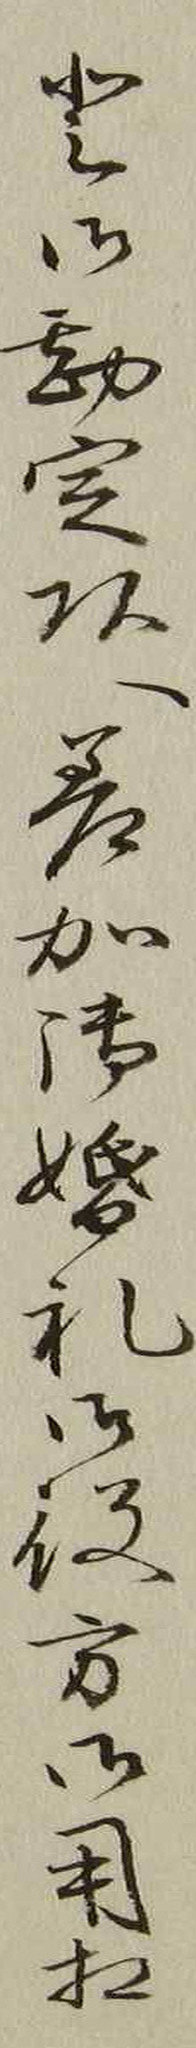登御勘定頭ヘ差加御婚礼御役方御用相
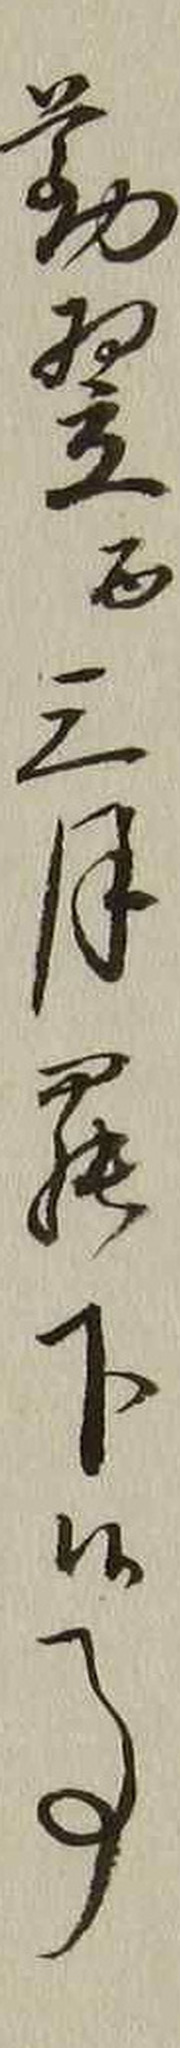勤翌酉三月罷下候事
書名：諸士系譜　巻之114　か之部22
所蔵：会津若松市立会津図書館
